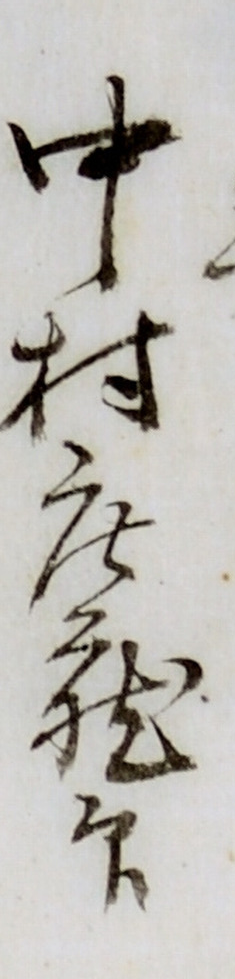中村庄蔵印
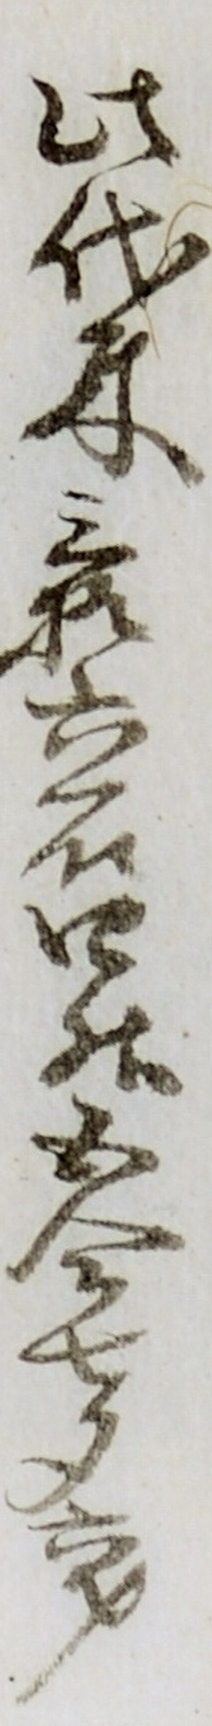此代米三拾六石四升五合七勺六才
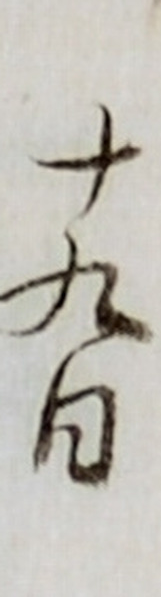十九日
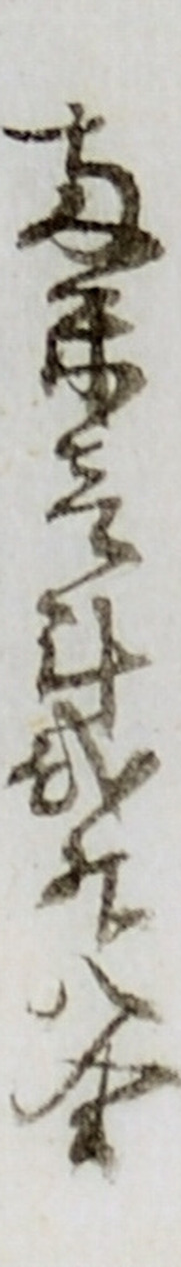両米壱斗弐升八合
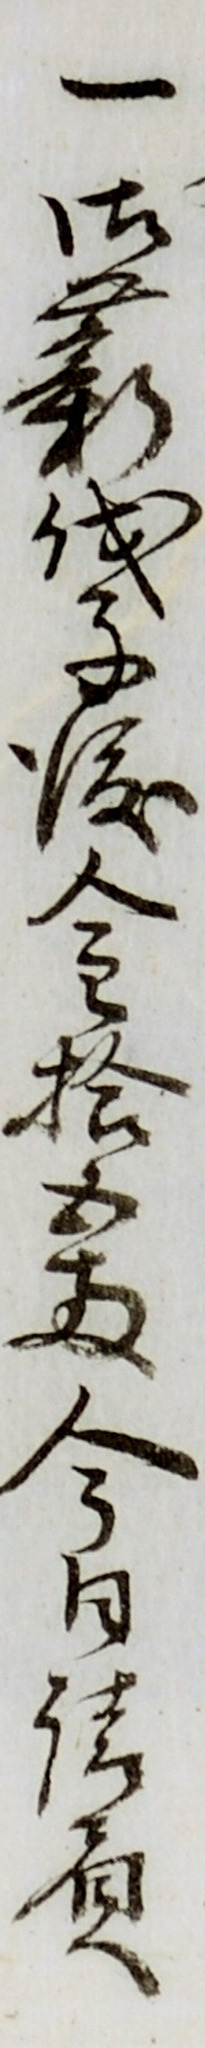一御薪伐子渡金拾五両今日請負
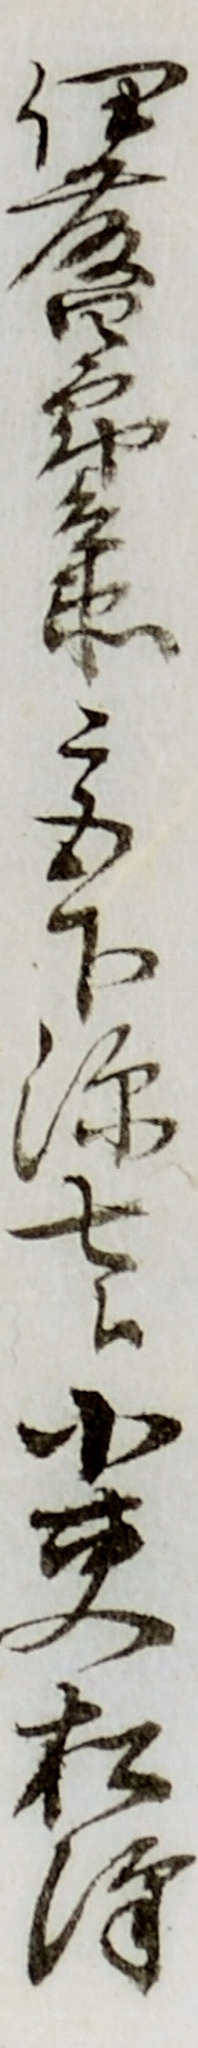伊藤四郎兵衛宮下深七え小吏松沢
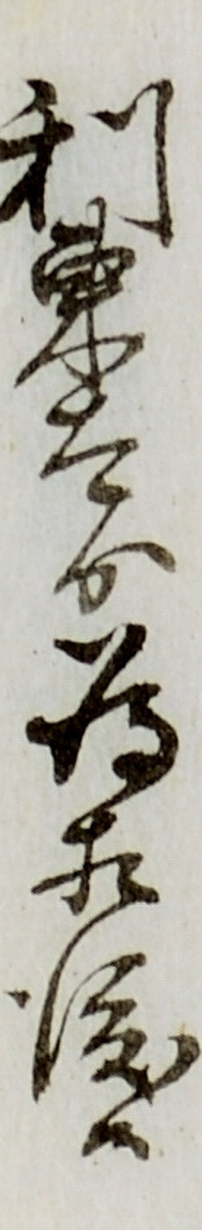利東太ゟ為相渡候
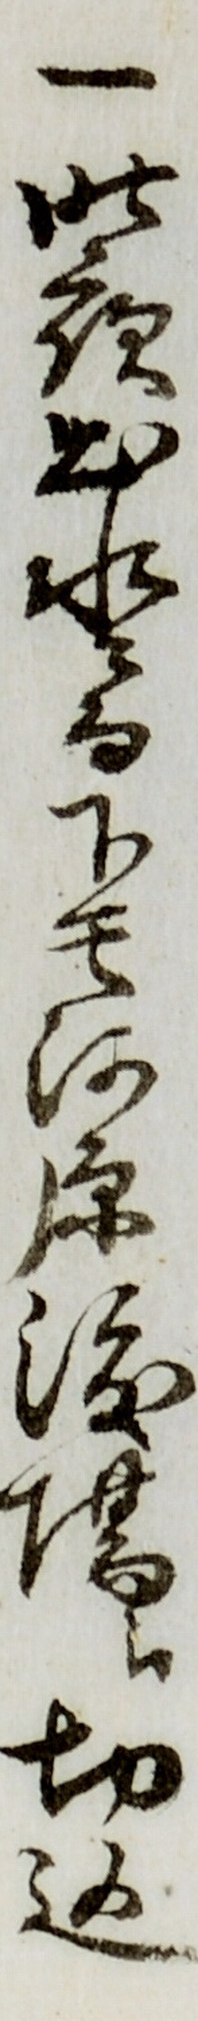一昨夜出水にて下モ河原渡場え切込
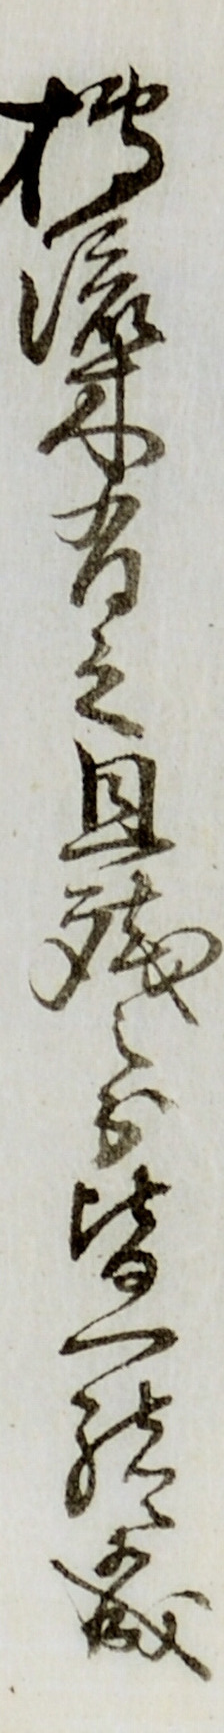榑流木有之且残之分皆一緒に相成
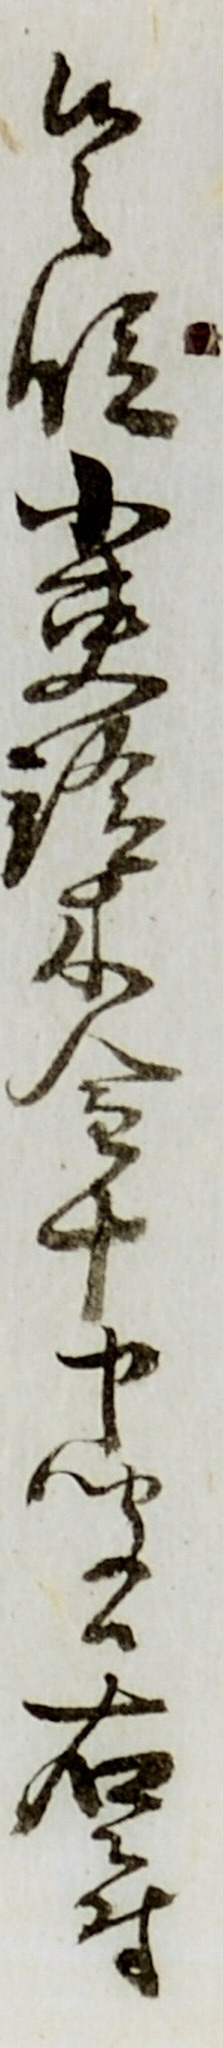候之段小吏鈴木金十申聞候右に付
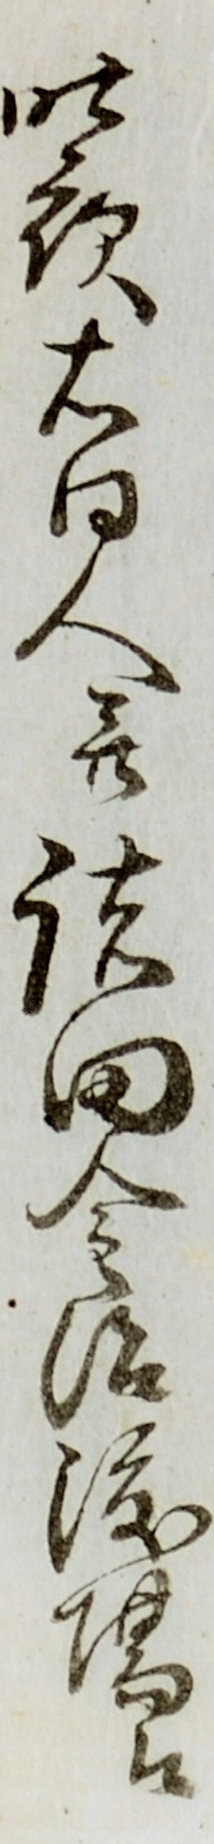昨夜右同人幷諸田金治渡場え
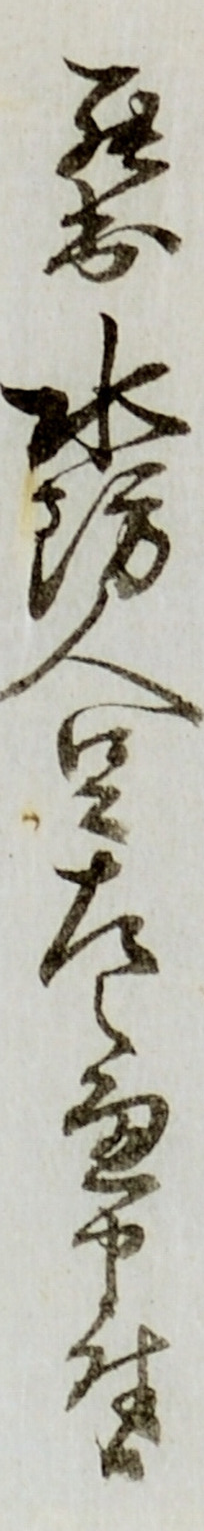罷出水防人足左之通申付候
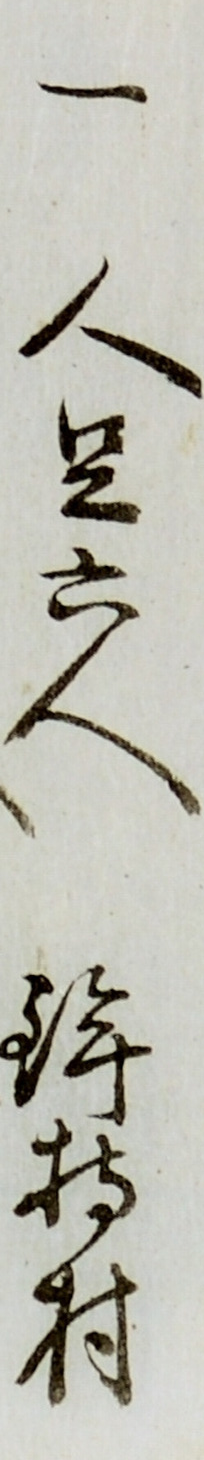一人足六人鉾持村
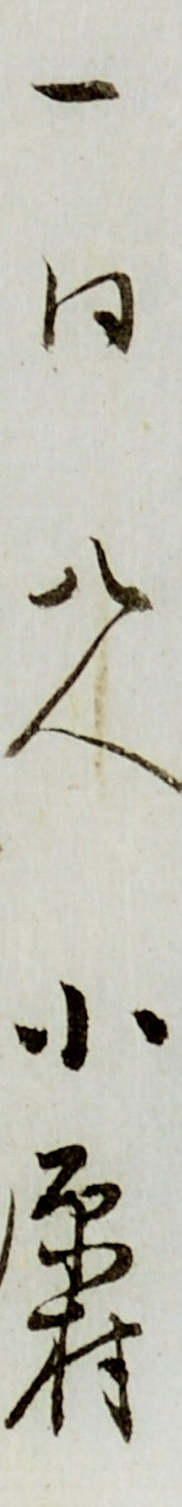一同八人小原村
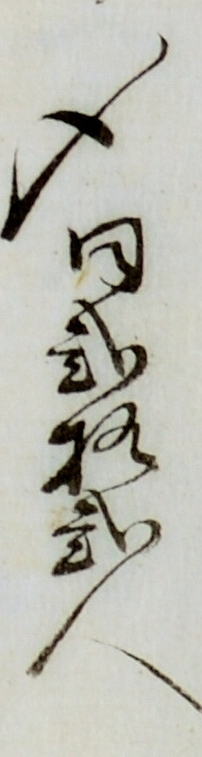〆同弐拾弐人
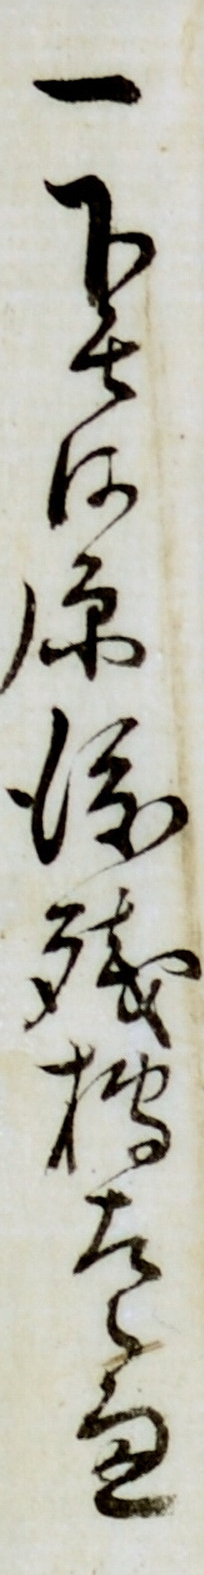一下モ河原渡残榑左之通
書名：山林方諸事御用留
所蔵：伊那市立高遠町図書館・合同会社AMANE
